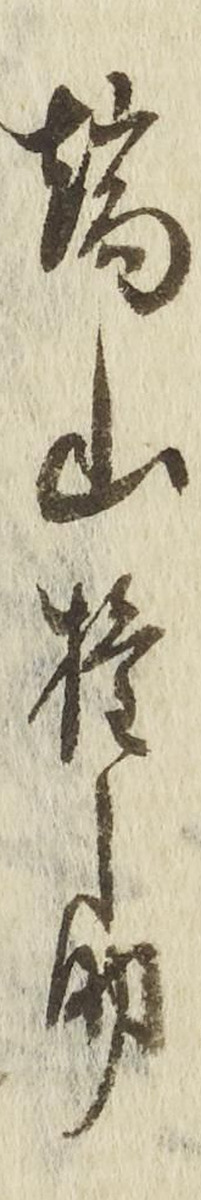端山権之助
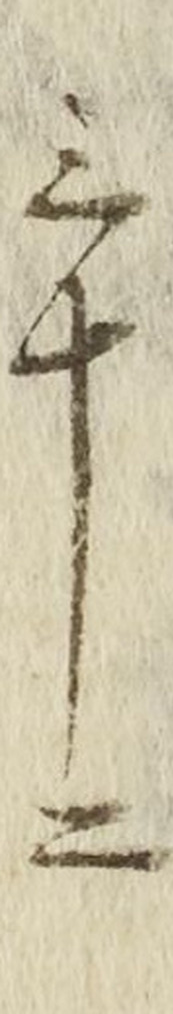三十二
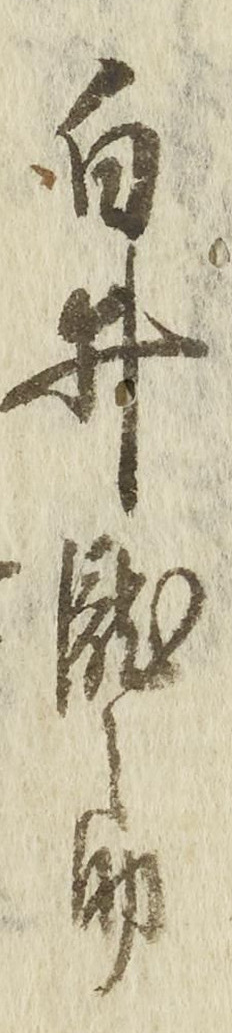白井瀧之助
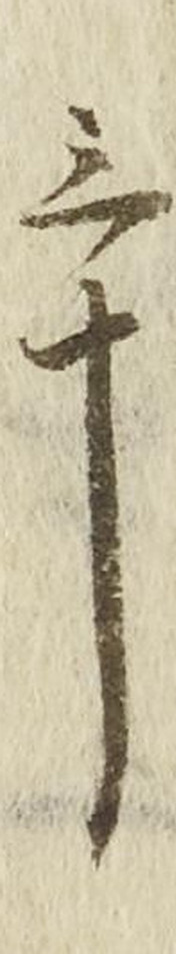三十八
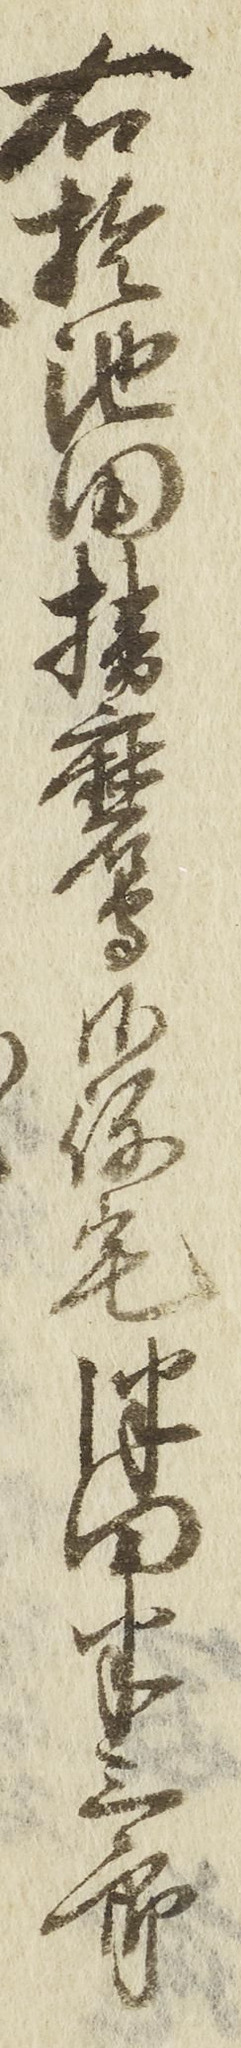右於池田播磨守御役宅伴田半三郎
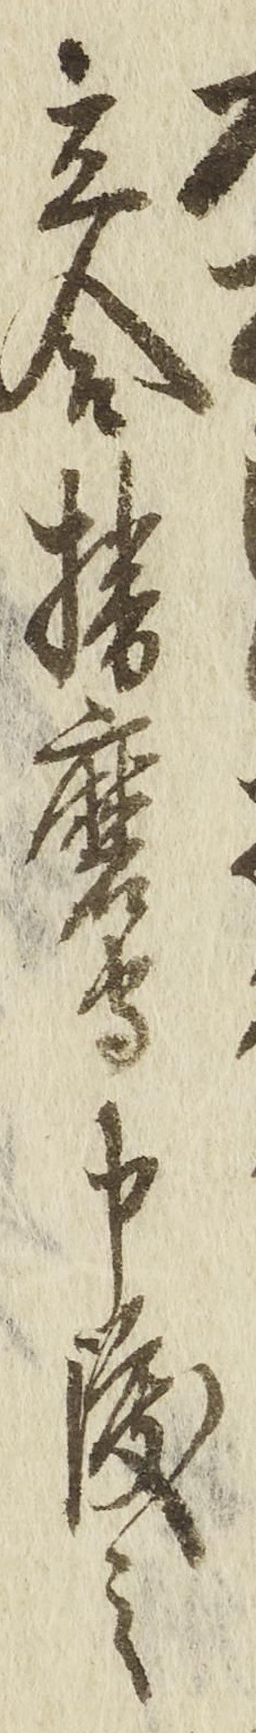立合播磨守申渡之
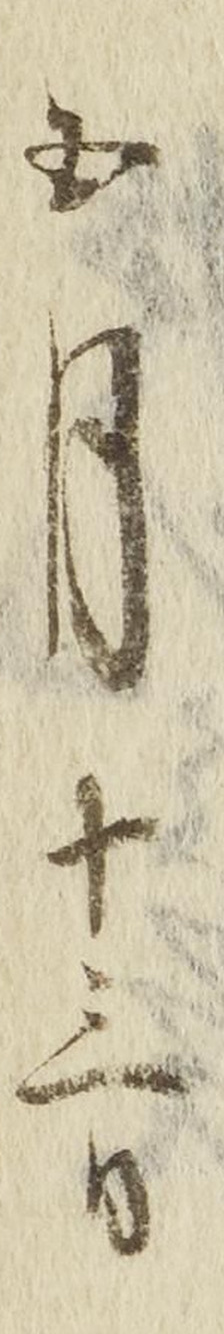五月十三日

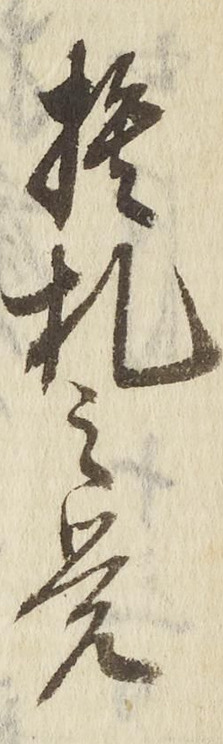提札之覚
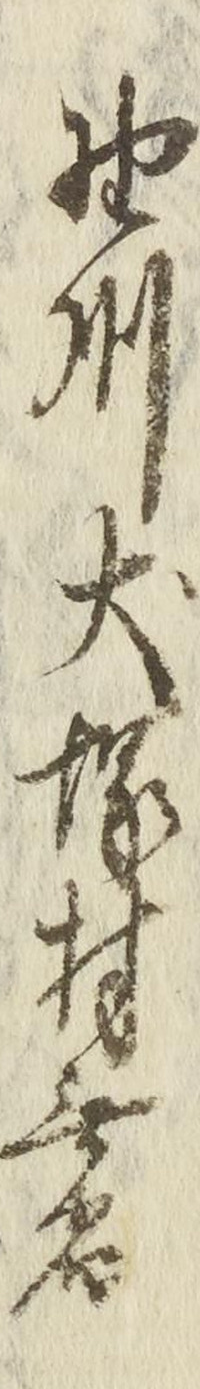野州大塚村無宿
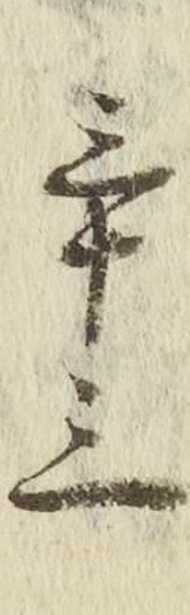三十三
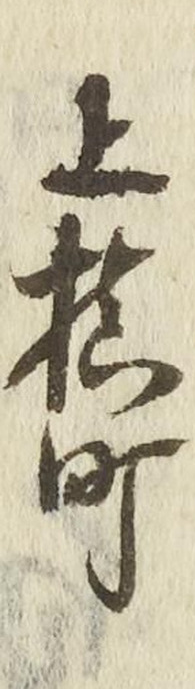上槙町
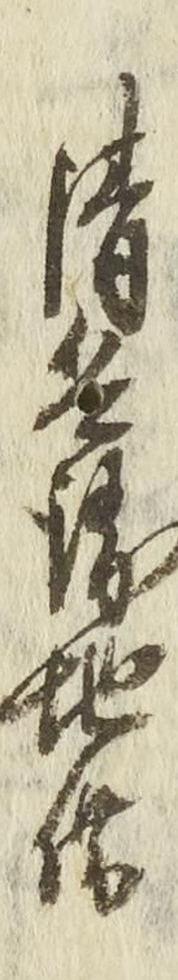清兵衛地借
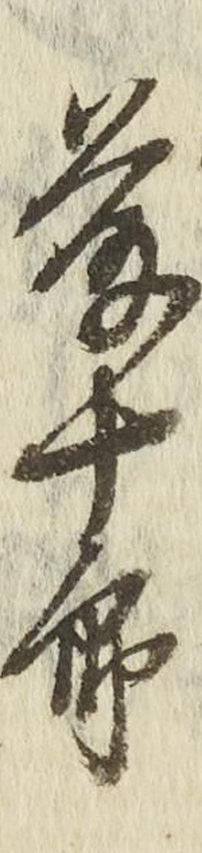藤十郎
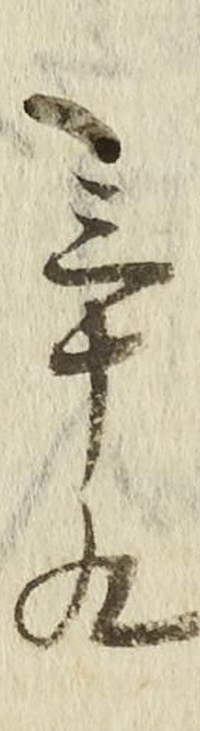三十九
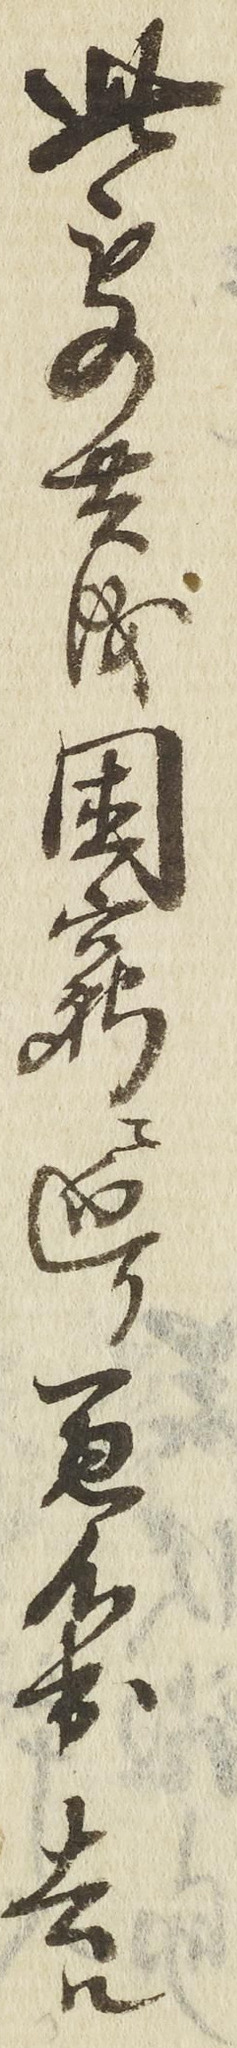此もの共儀困窮二迫り悪心出去ㇽ
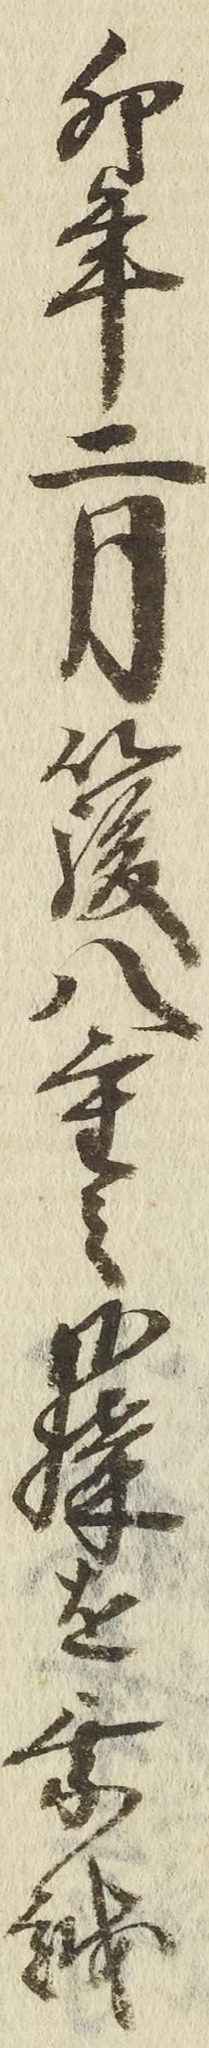卯年二月以後八重之御構を乗越
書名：世説ヤンレフシ写、駿州田中城地震ニ付内外破損御届書、豫州大洲城地震ニ付内外破損御届書・封廻状
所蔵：東京大学地震研究所図書室 Earthquake Research Institute Library, The University of Tokyo, JAPAN
